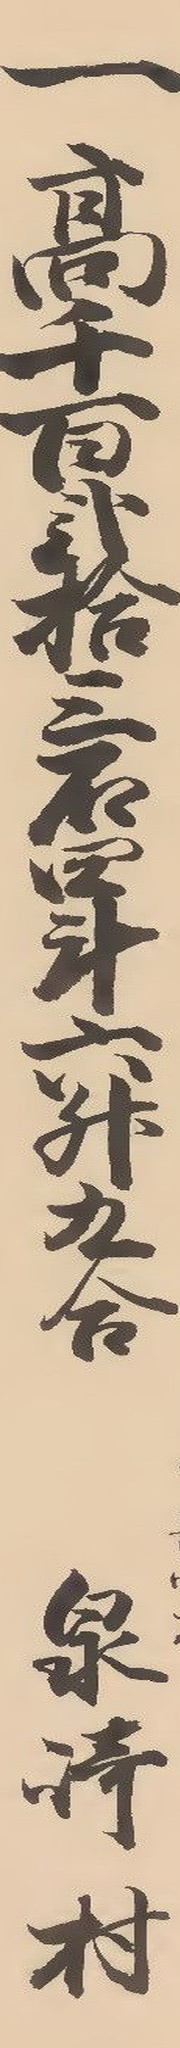一高千百弐拾三石四斗六升九合泉崎村
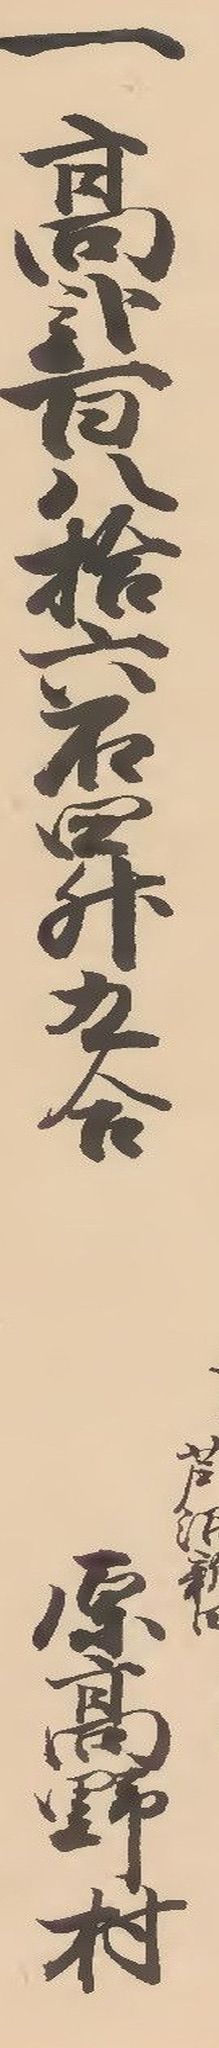一高弐百八拾六石四升九合原高野村

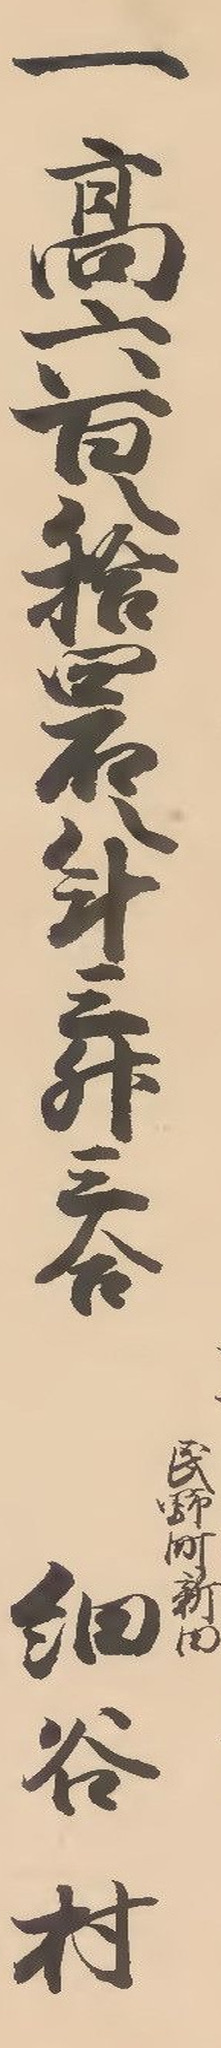一高六百八拾四石八斗三升三合細谷村
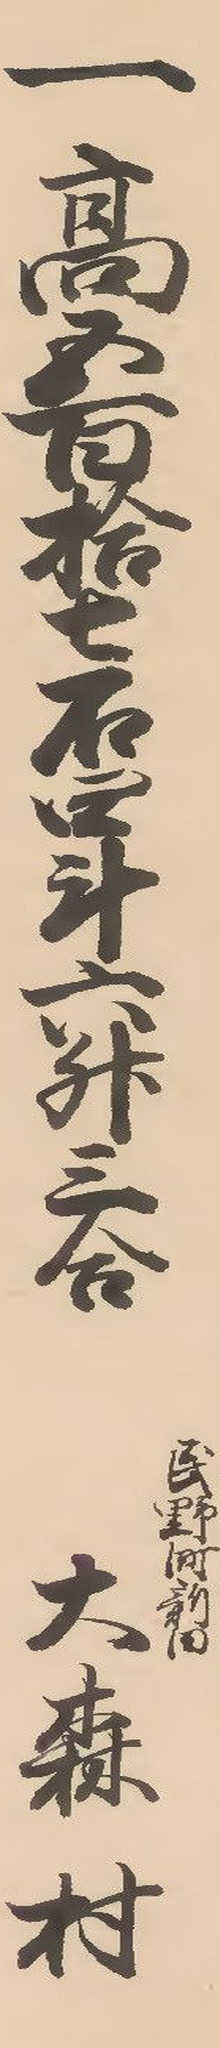一高五百拾七石四斗六升三合大森村
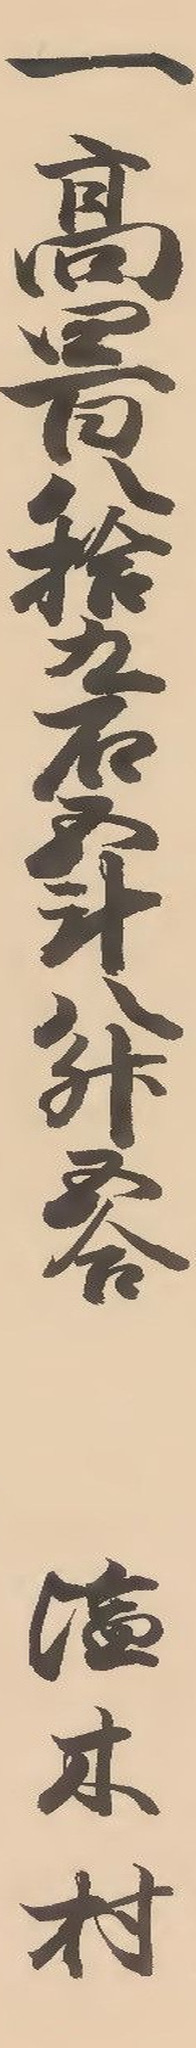一高四百八拾九石五斗八升五合塩木村
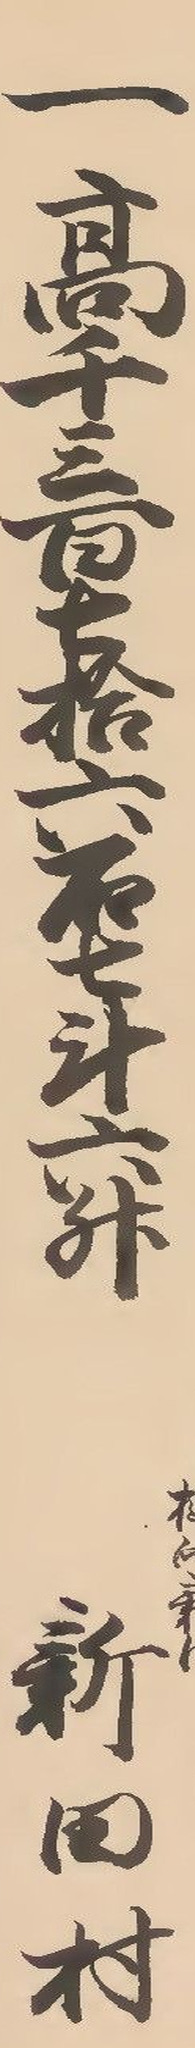一高千三百七拾六石七斗六升新田村
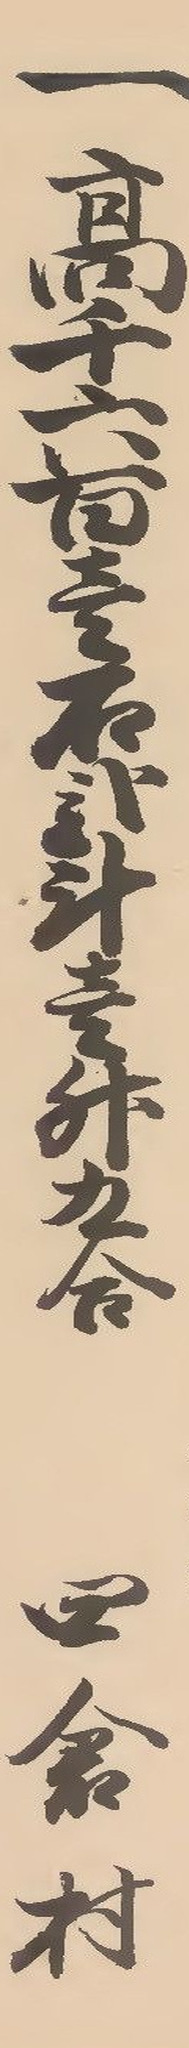一高千六百壱石弐斗壱升九合四倉村
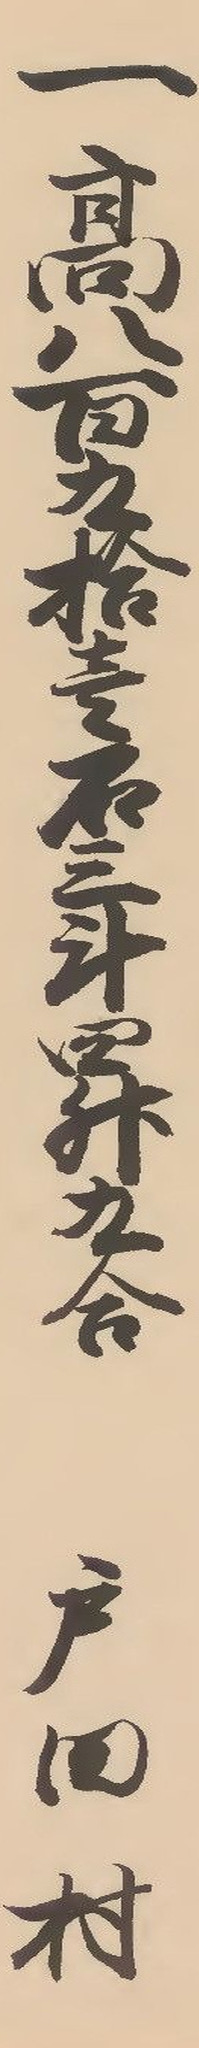一高八百九拾壱石三斗四升九合戸田村
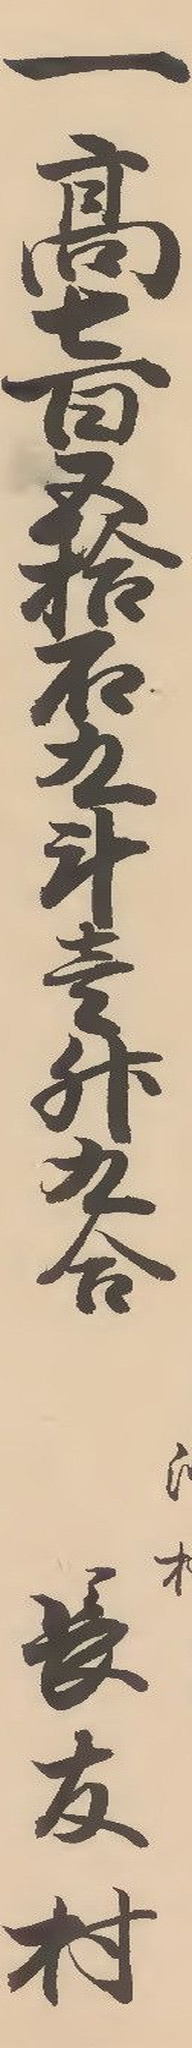一高七百五拾石九斗壱升九合長友村
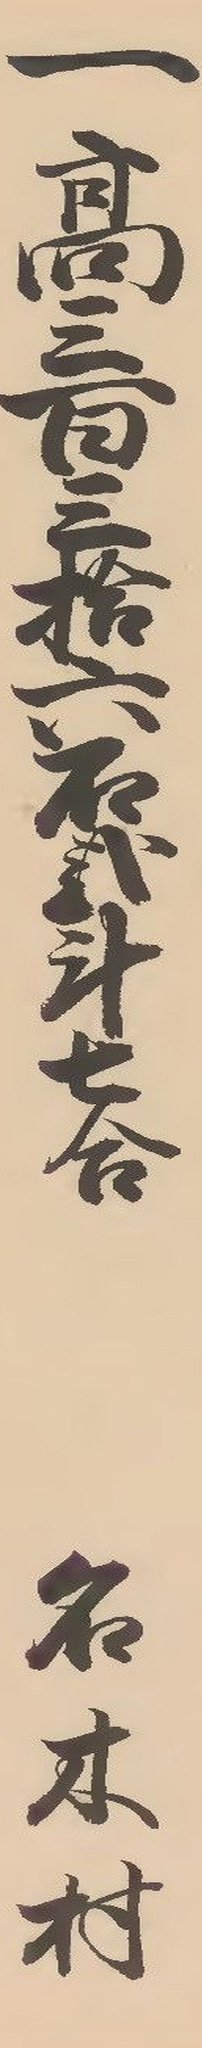一高三百三拾六石弐斗七合名木村

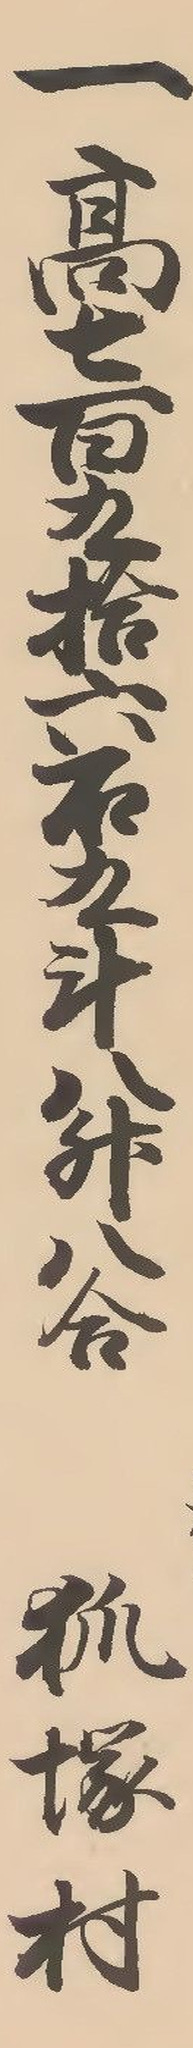一高七百九拾六石九斗八升八合狐塚村
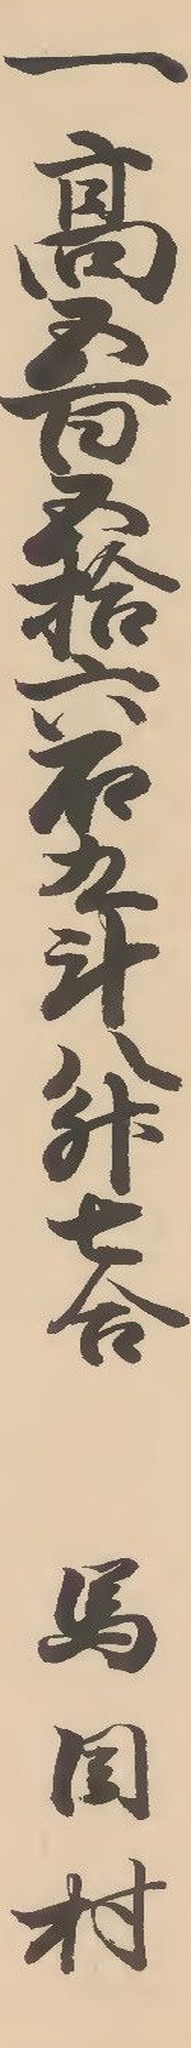一高五百五拾六石九斗八升七合馬目村
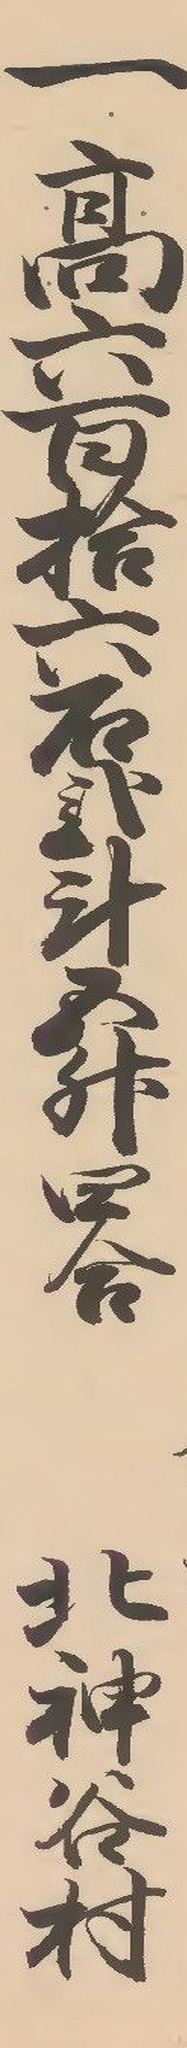一高六百拾六石弐斗五升四合北神谷村
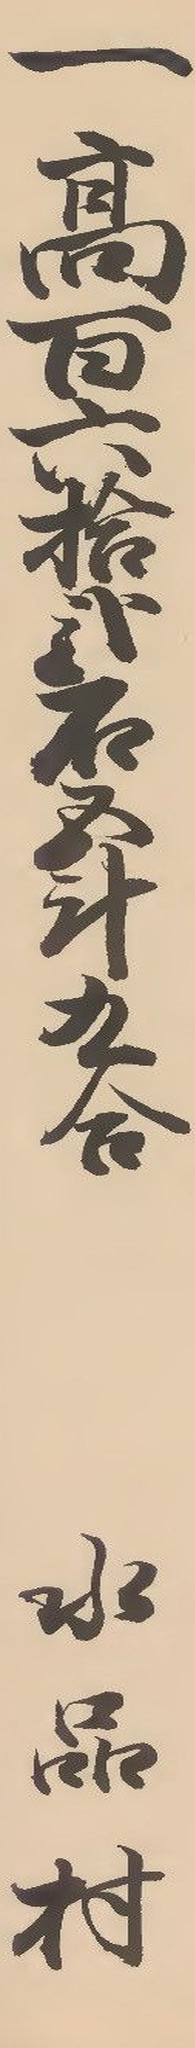一高百六拾弐石五斗九合水品村
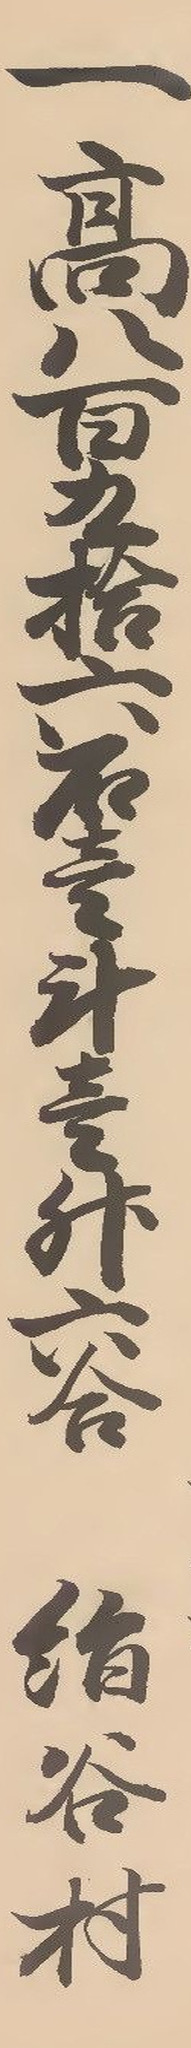一高八百九拾六石壱斗壱升六谷絹谷村
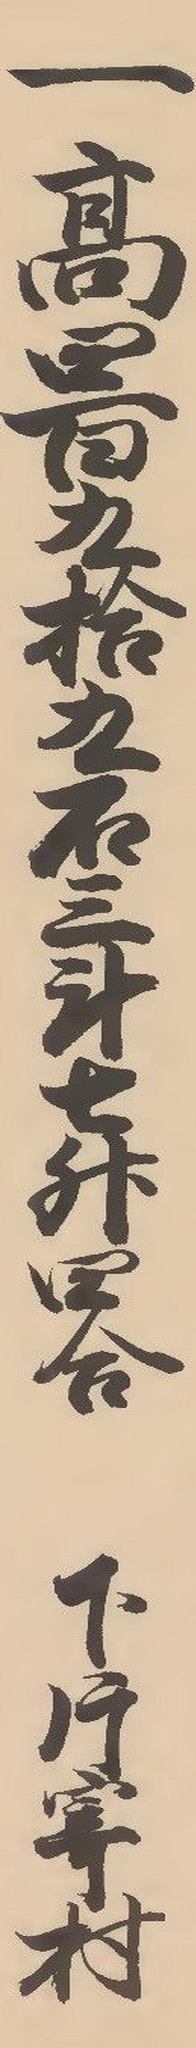一高四百九拾九石三斗七升四合下片寄村
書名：陸奥国郷帳　３
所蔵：国立公文書館 National Archives of Japan
